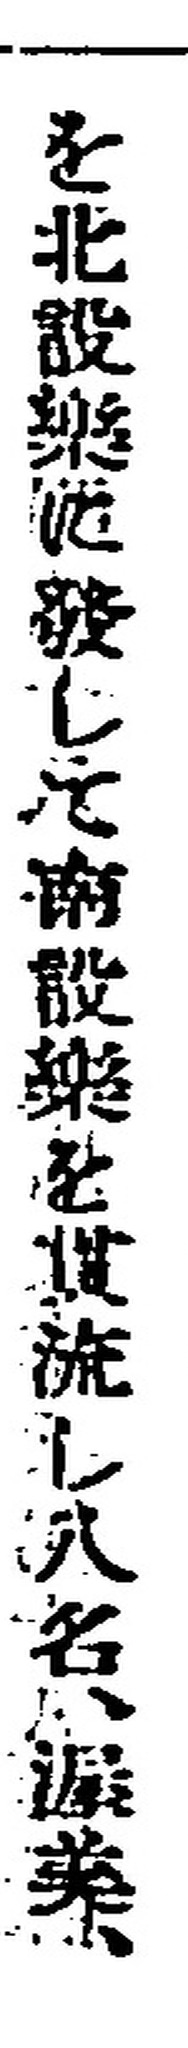を北設楽に発して南設楽を貫流し八名、渥美、
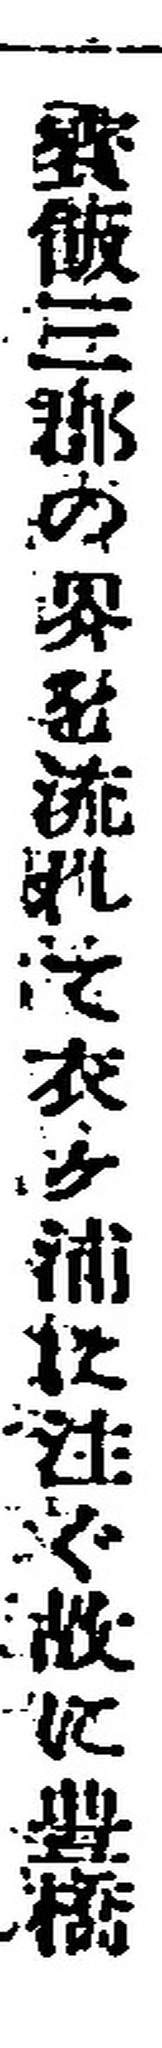宝飯三郡の界を流れて衣ヶ浦に注ぐ故に豊橋
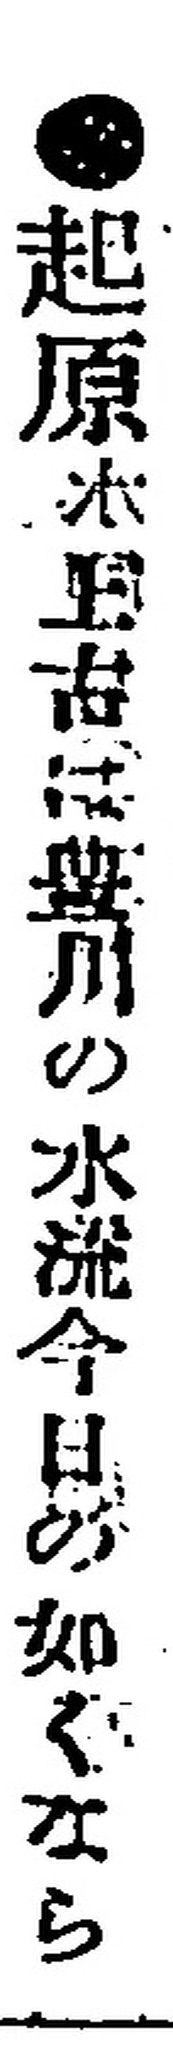●起原上古は豊川の水流今日の如くなら
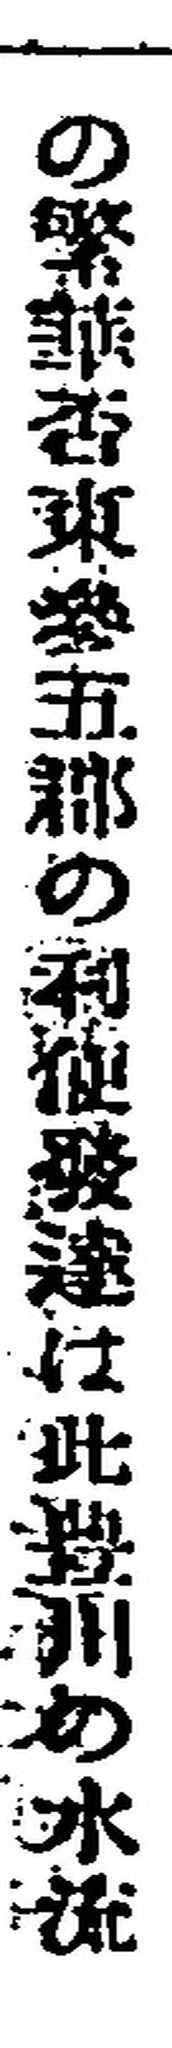の繁華否東参五郡の利便発達は此豊川の水流
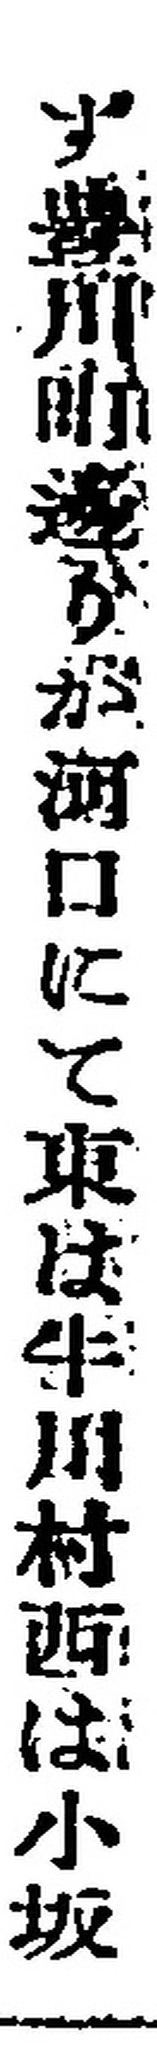ず豊川町辺りが河口にて東は牛川村西は小坂
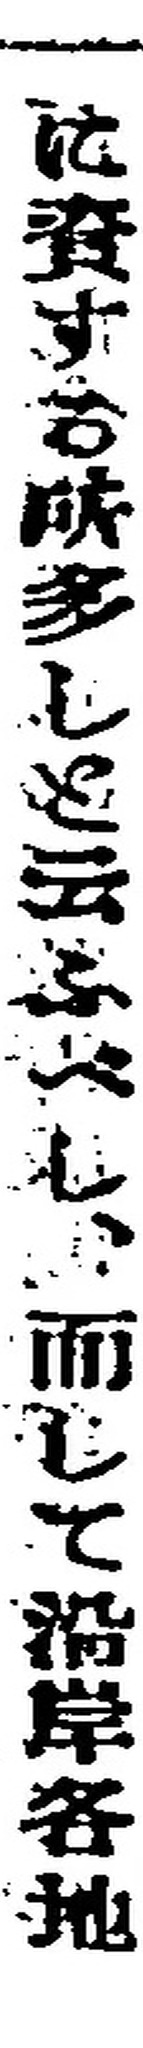に資する所多しと云ふべし、而して沿岸各地
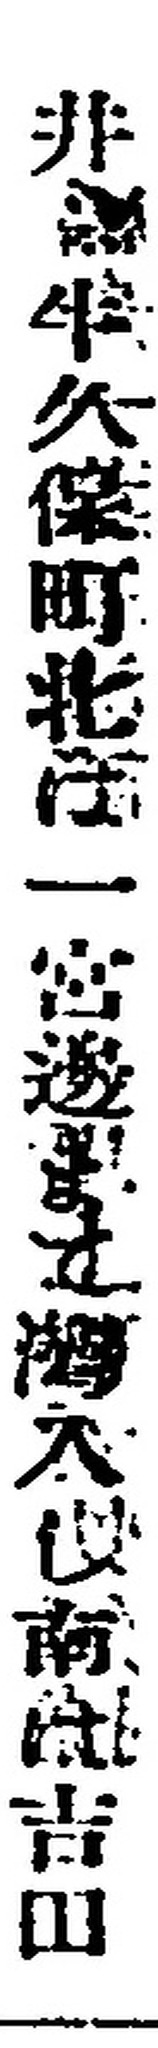井、牛久保町北は一宮辺まて湾入し南は吉田
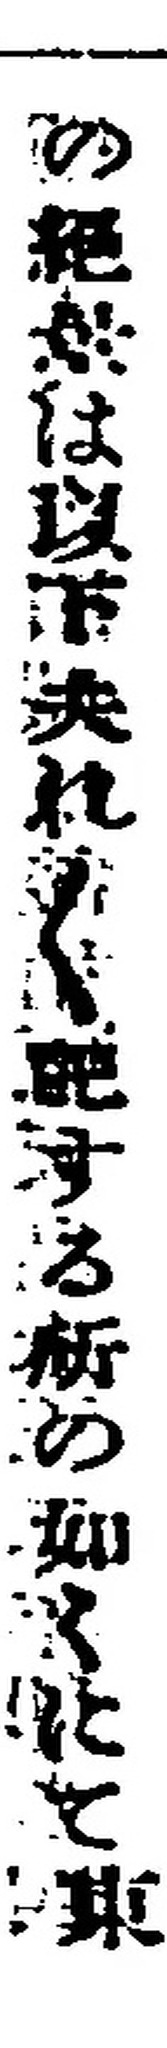の絶景は以下夫れ〳〵記する所の如くにて東
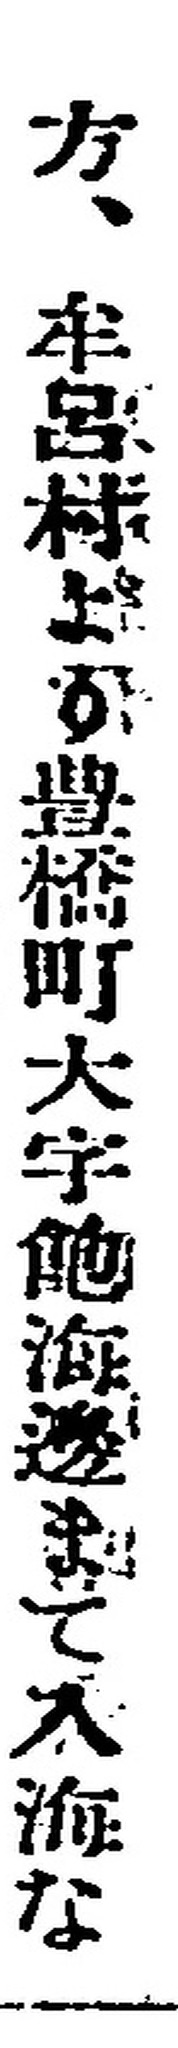方、牟呂村より豊橋町大字飽海辺まて入海な
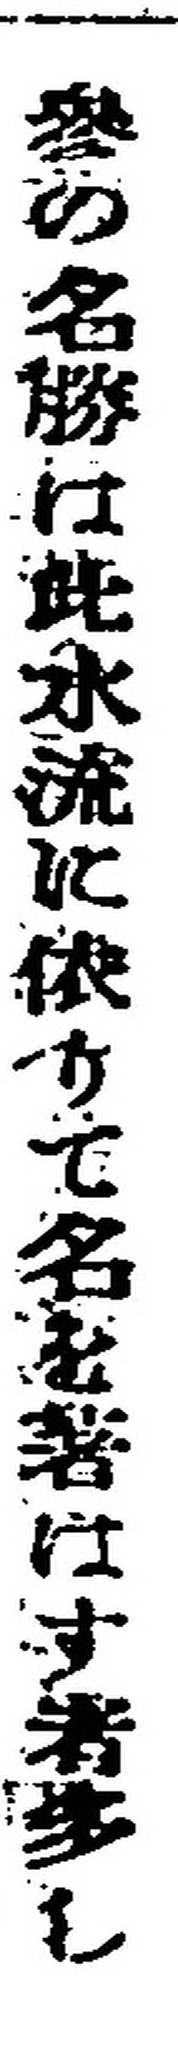参の名勝は此水流に依りて名を著はす者多し
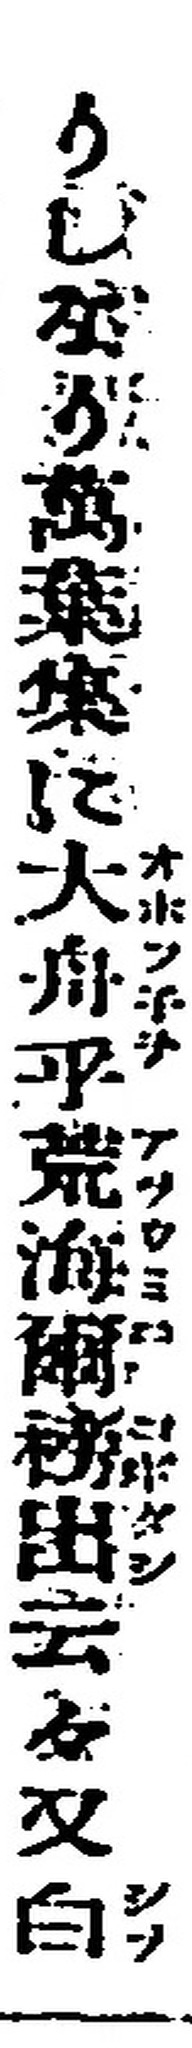りしなり万葉集に大舟乎荒海爾䅭出云々又白
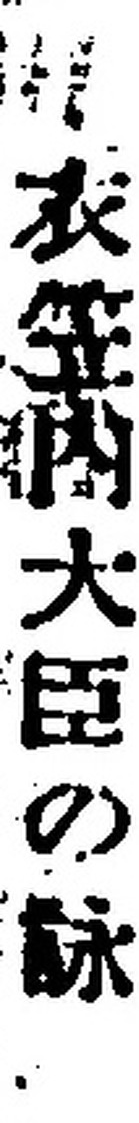衣笠内大臣の詠
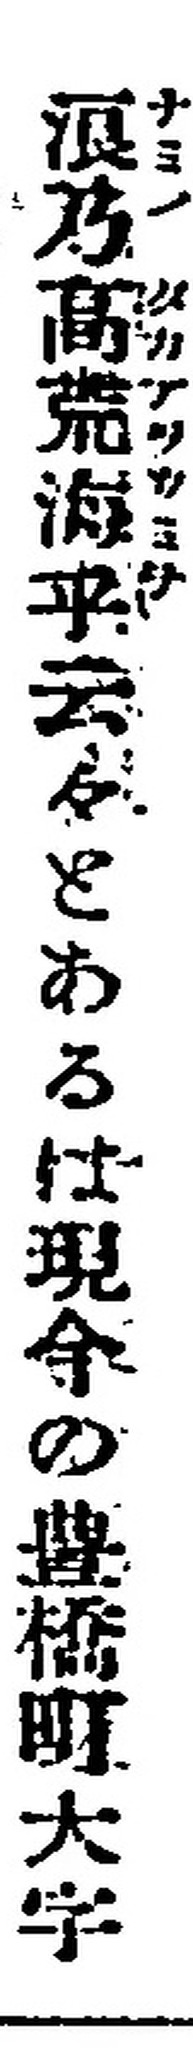浪乃高荒海乎云々とあるは現今の豊橋町大字
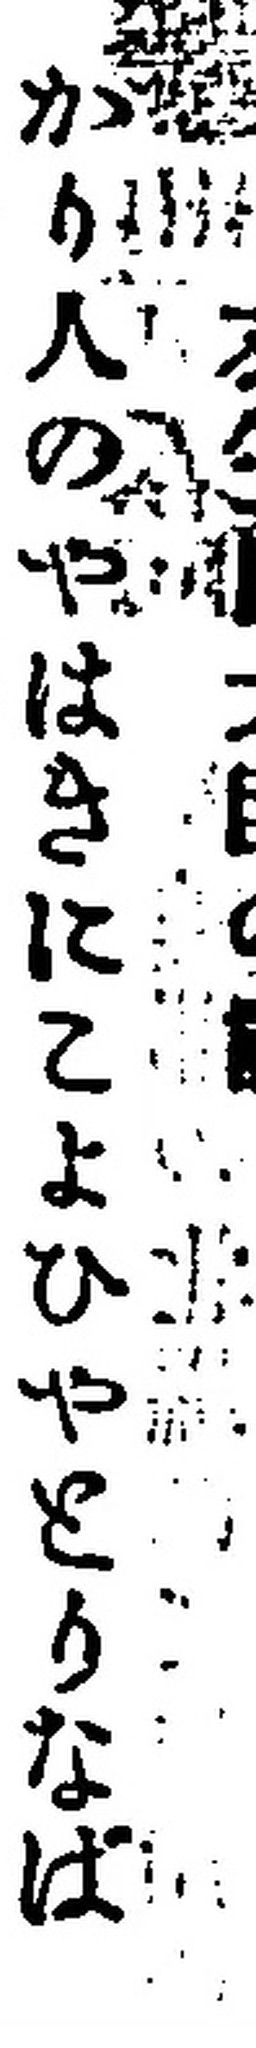かり人のやはきにこよひやとりなば
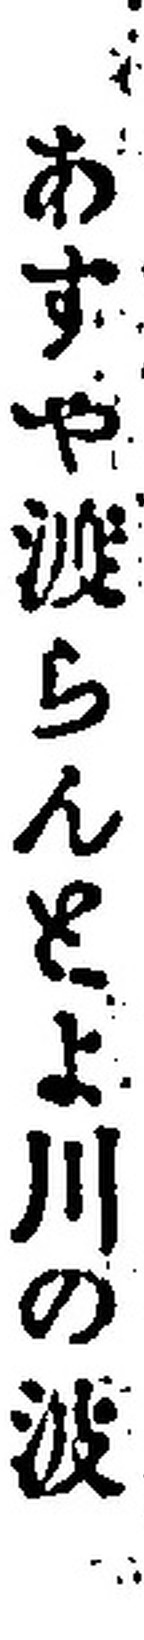あすや渡らんとよ川の波
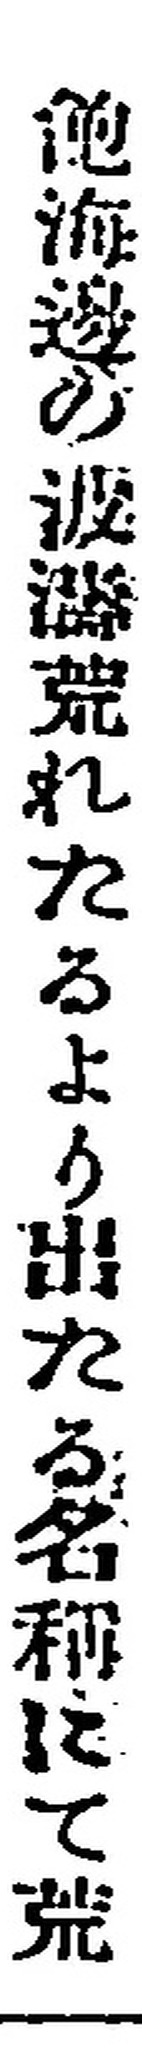飽海辺の波濤荒れたるより出たる名称にて荒
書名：東参名勝案内
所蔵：国立国会図書館 National Diet Library, JAPAN
